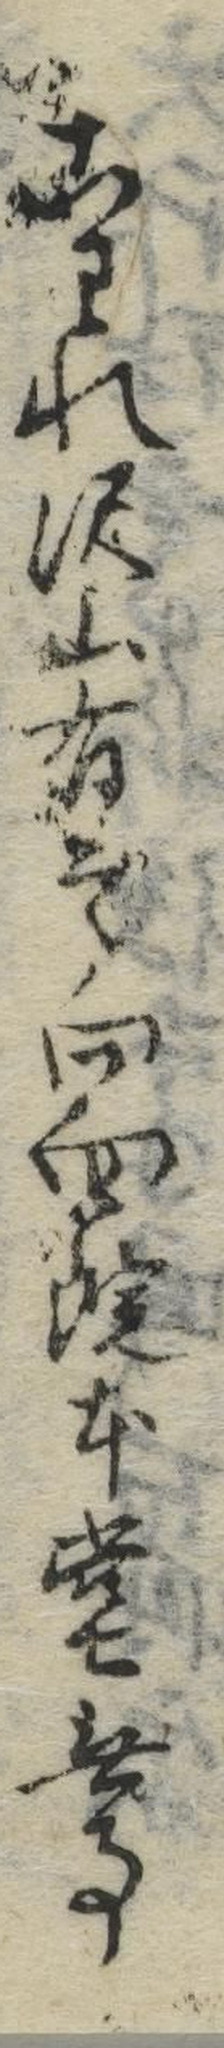こわれ沢山有之回向院本堂無事
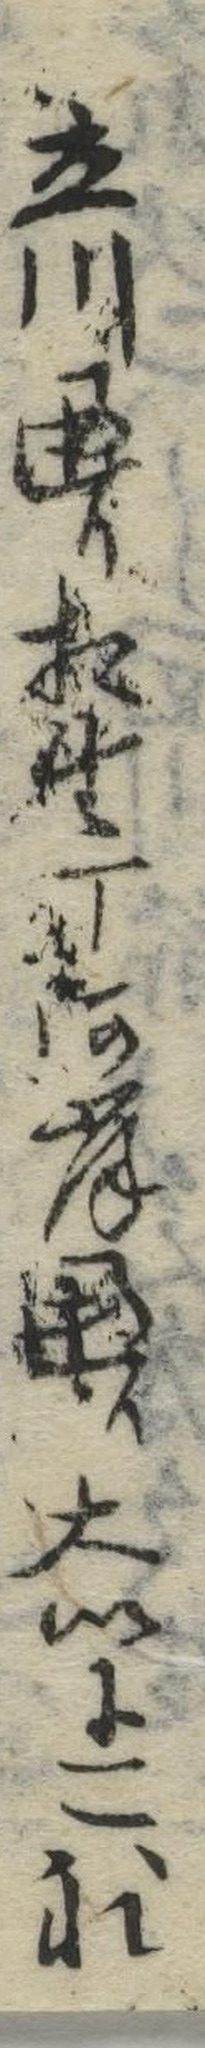立川通り相生丁河岸通り大いにこわれ
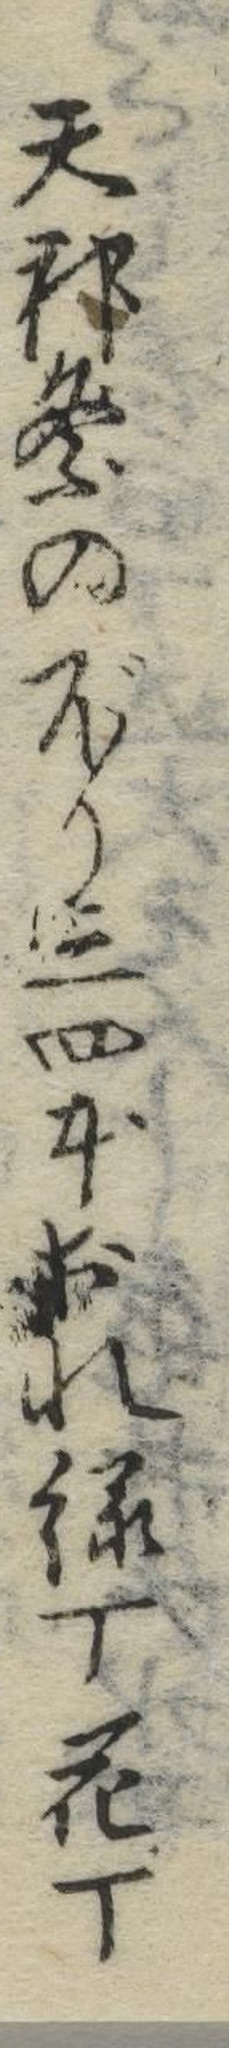天神祭のぼり三四本おれ緑丁花丁
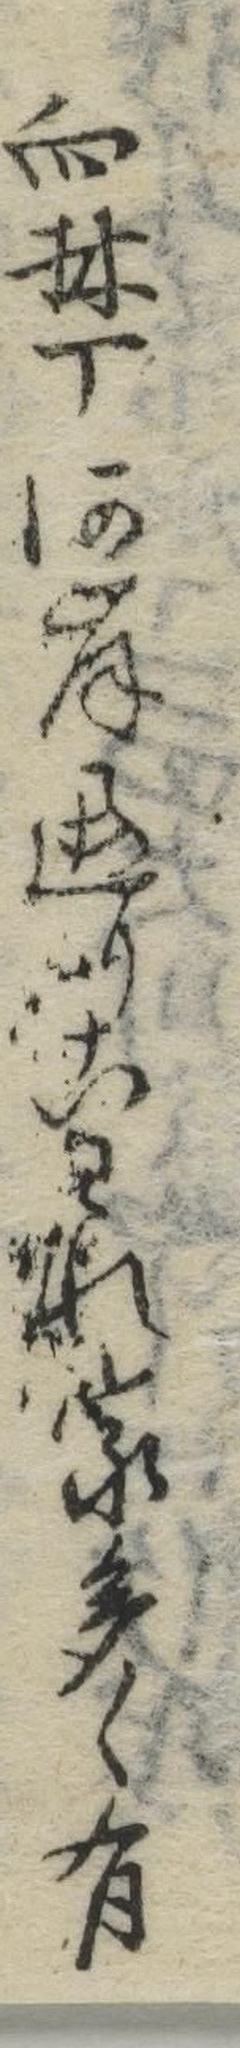向林丁河岸通りこわれ家多く有
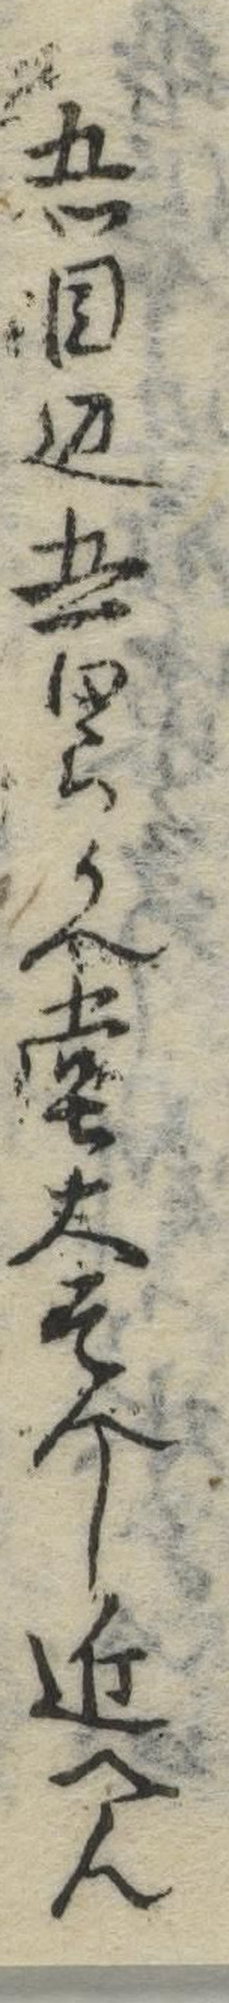五ッ目辺五百らかん堂大そんし近へん
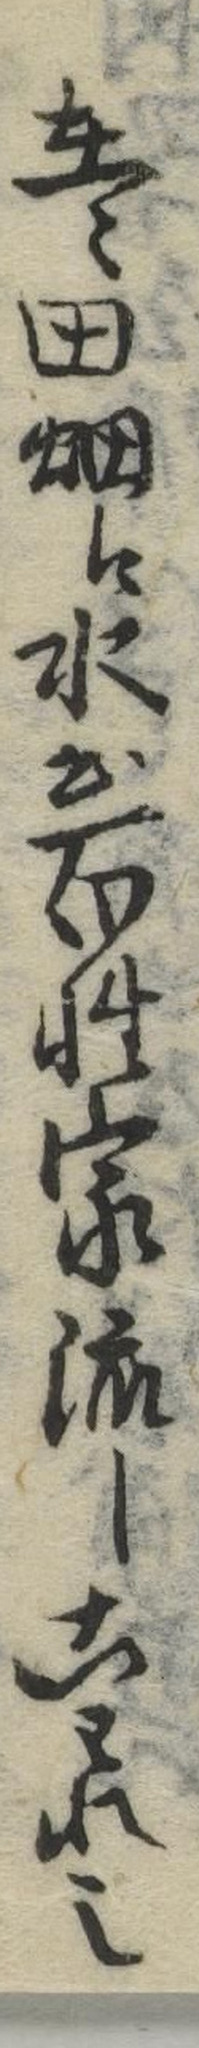在々田畑江水出百性家流しこわれ之
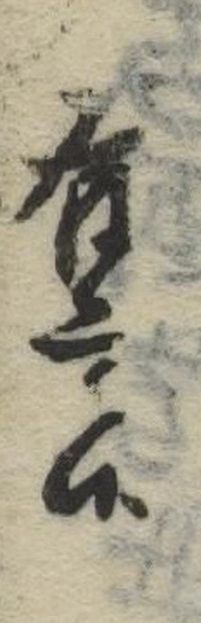有之候

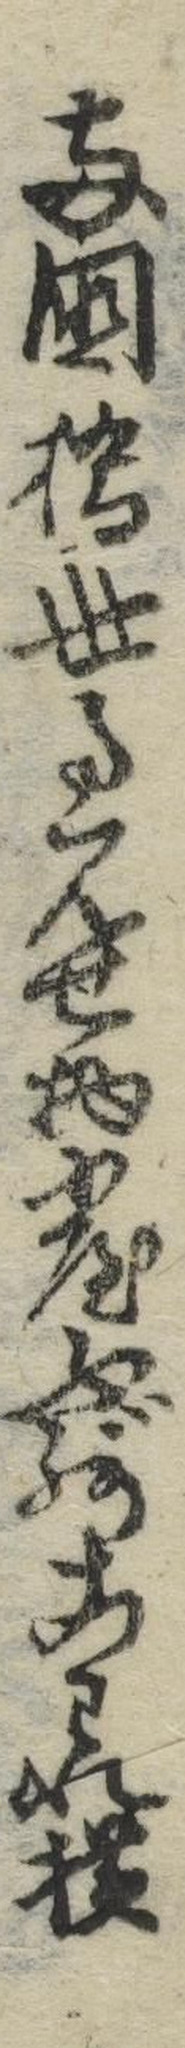両国橋世事見世物小屋不残こわれ横
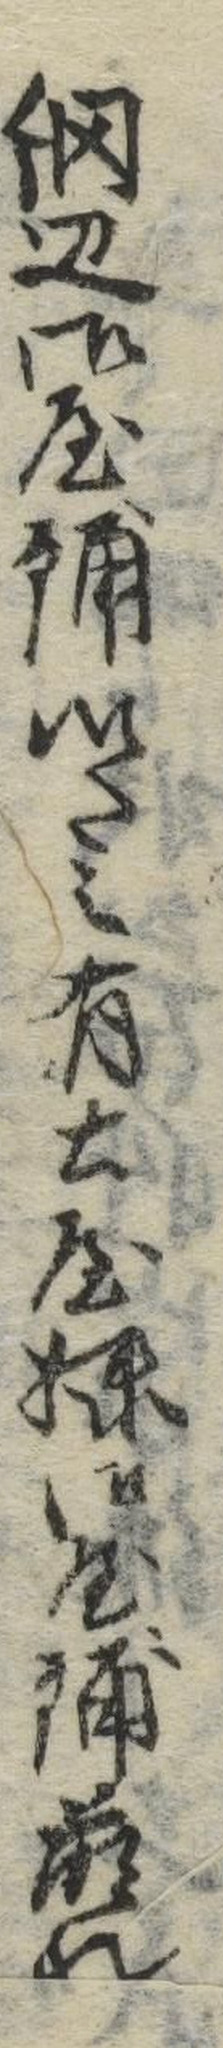佃辺御屋鋪いたみ有土屋様御屋鋪崩れ
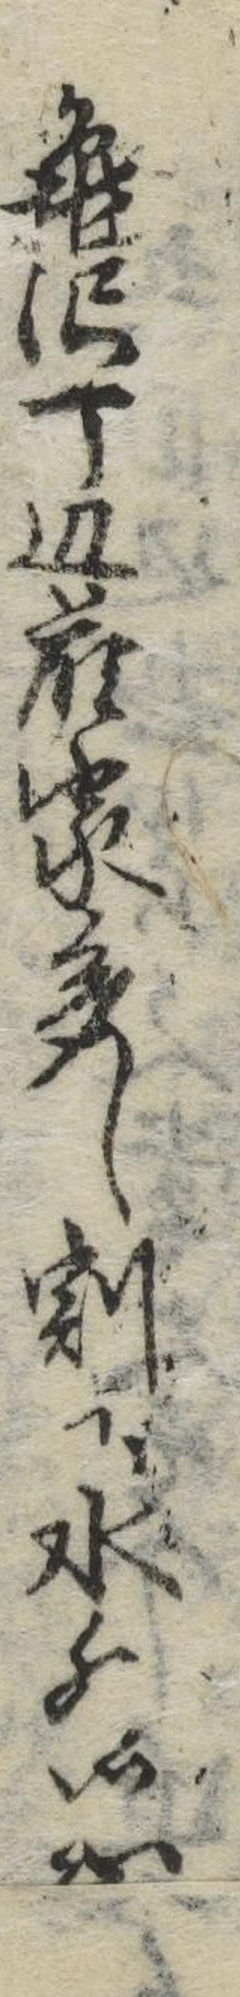亀沢丁辺崩家多し割下水水流処
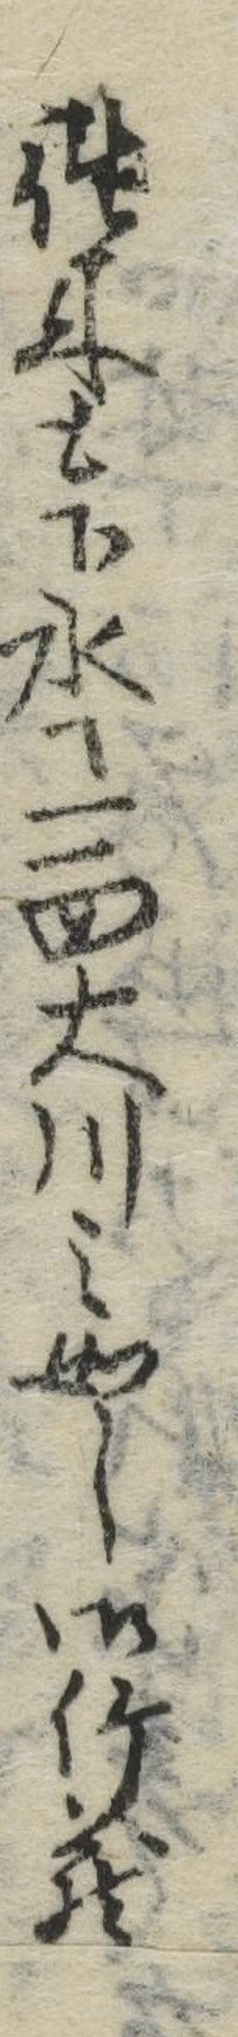往来も下水て一面大川の如し御竹蔵
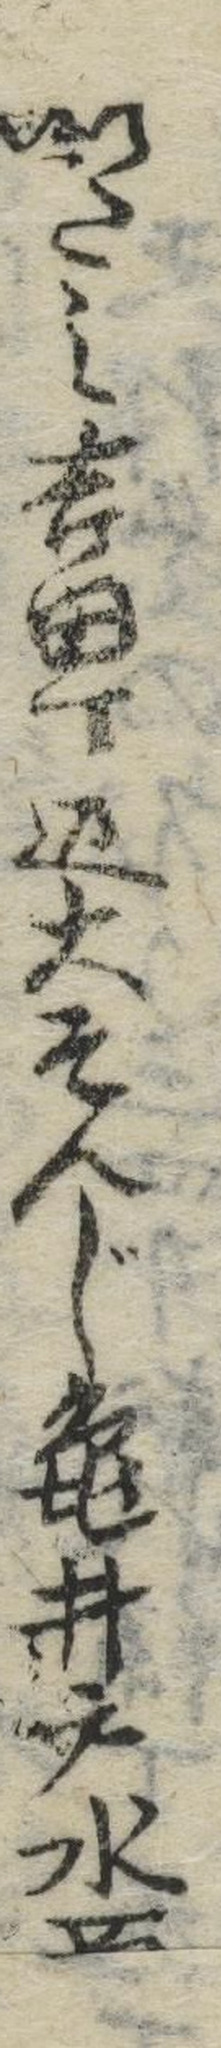いたみ吉田丁辺大そんじ亀井戸水西
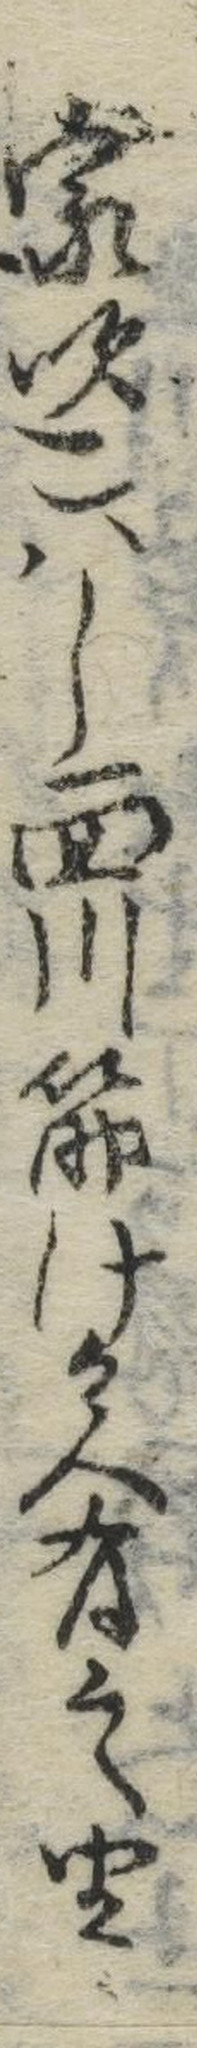家吹こハし面川筋けか人有之由
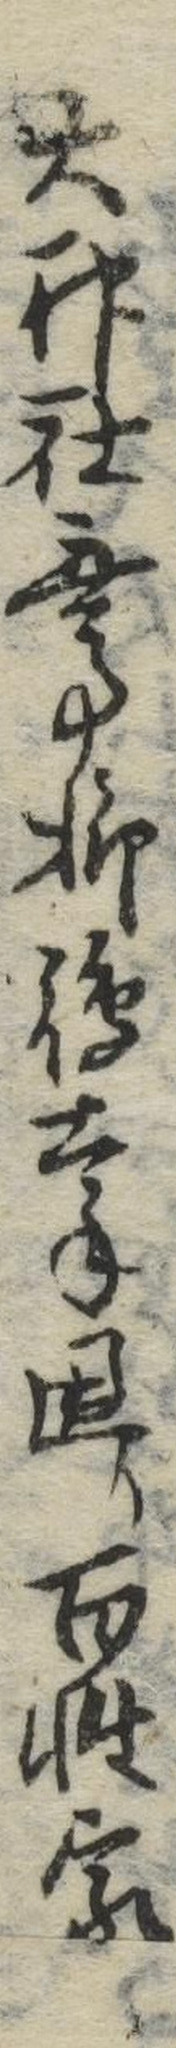大神社無事柳嶋土手廻百姓家
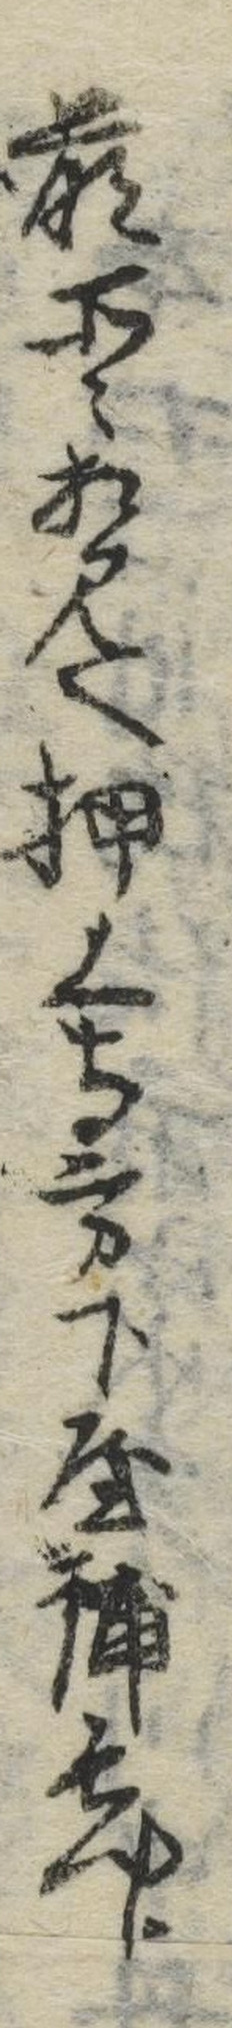崩所々相見へ押上寺方下屋鋪そんじ
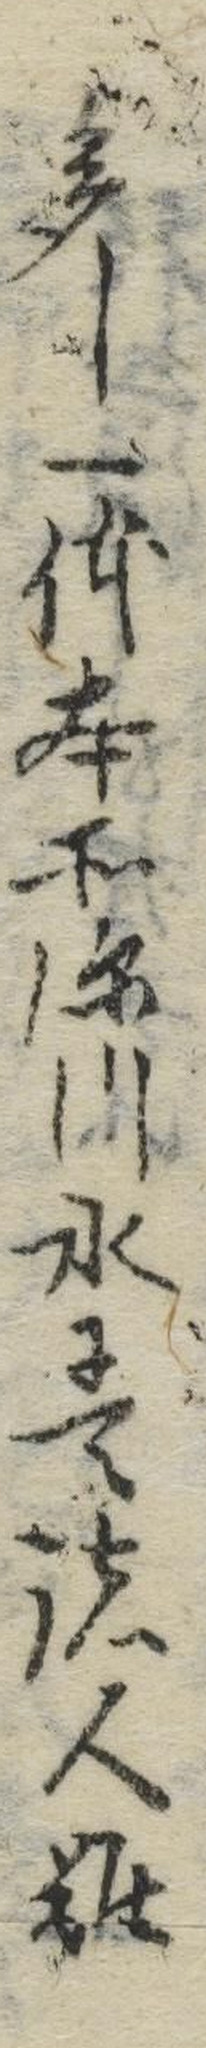多し一体本所深川水にて諸人難
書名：安政三年辰八月廿五日夜　大江都御屋敷方寺社市中共　大嵐水入場所明細書之寫　并街道筋近郷聞書
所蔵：東京大学地震研究所図書室 Earthquake Research Institute Library, The University of Tokyo, JAPAN
